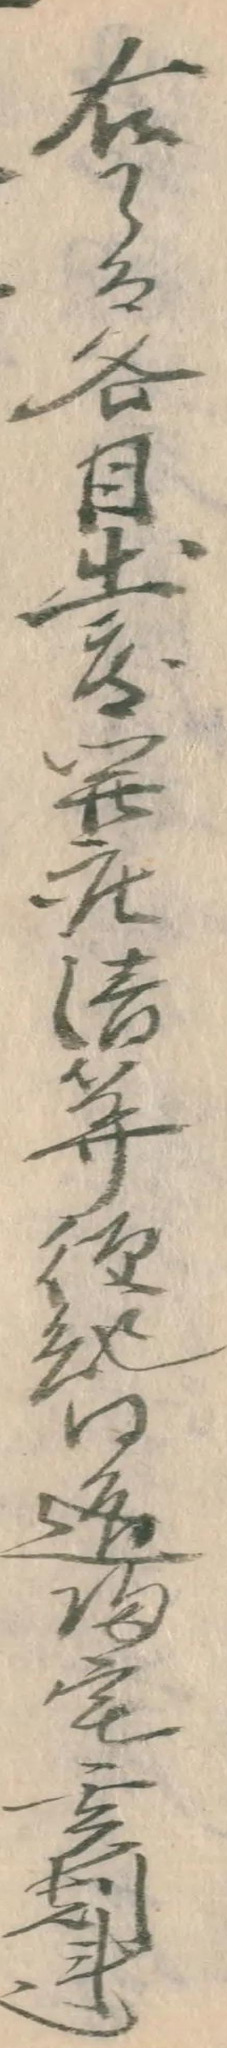右了而各目出度開座清算経紀同道帰宅亥刻斗也
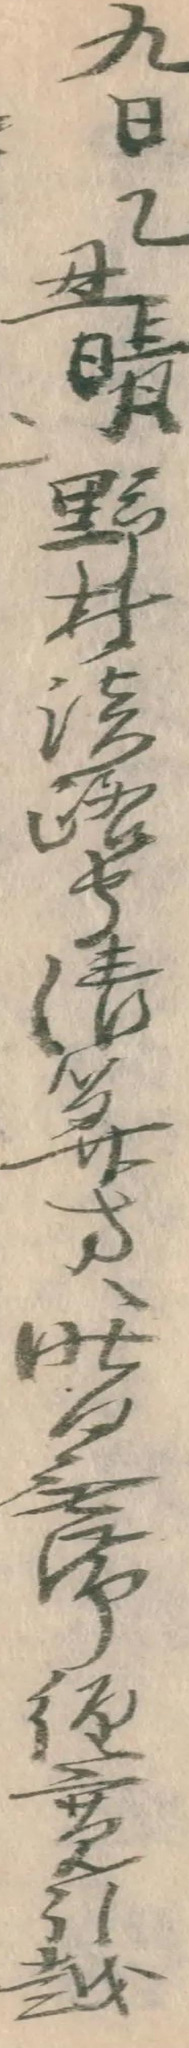九日乙丑晴野村淡路守清算方へ昨日無滞経寛引越
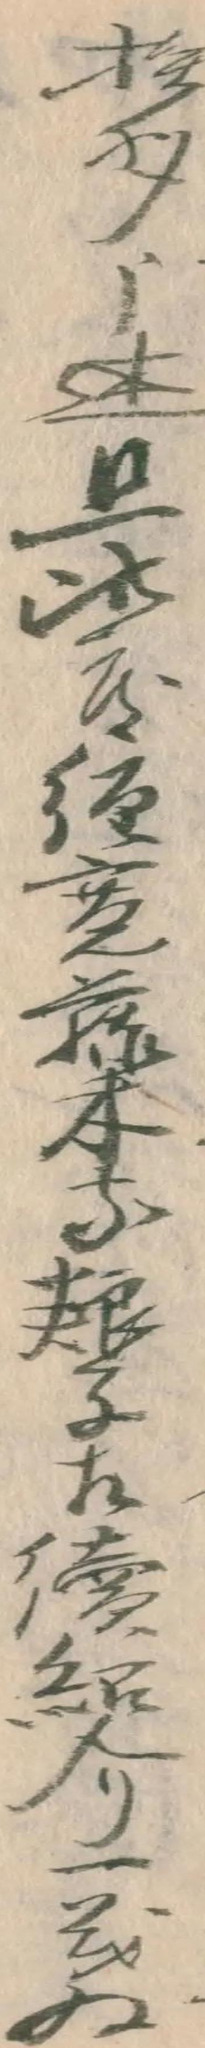挨拶申述且此度経寛藤木家養子相續紹介一義為
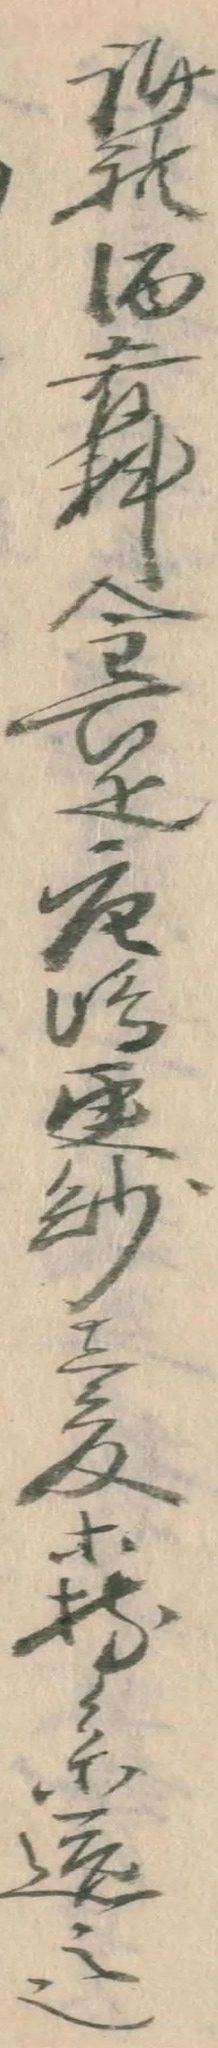訴頼酒肴料金百疋唐島更紗壱反等持参送之也
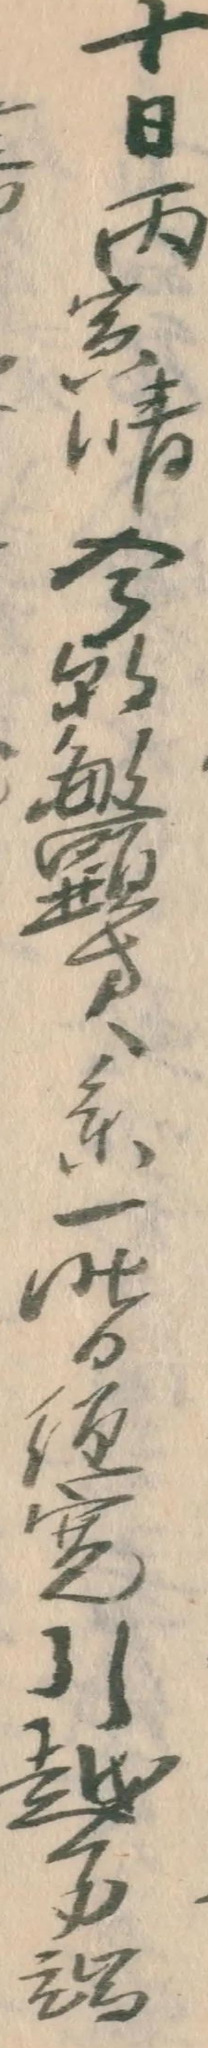十日丙寅晴今朝敏顕方へ参一昨日経寛引越万端
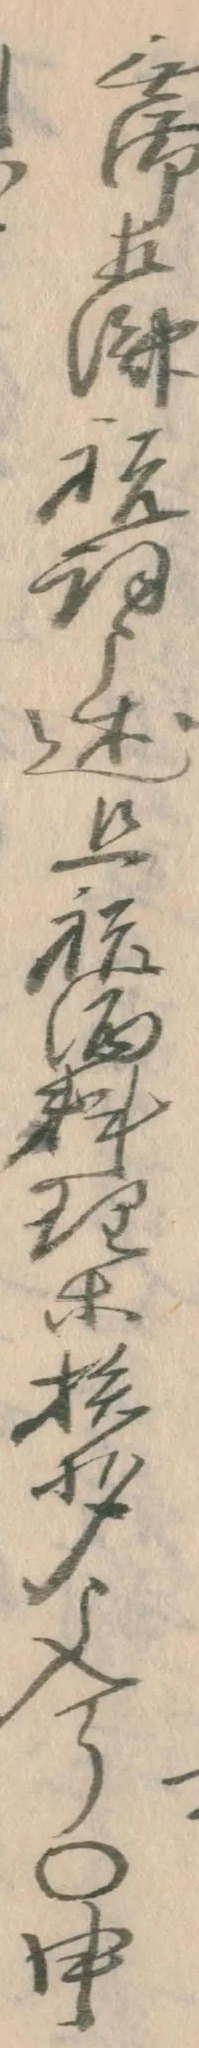無滞相済祝詞申述且祝酒料理等挨拶申入了○申
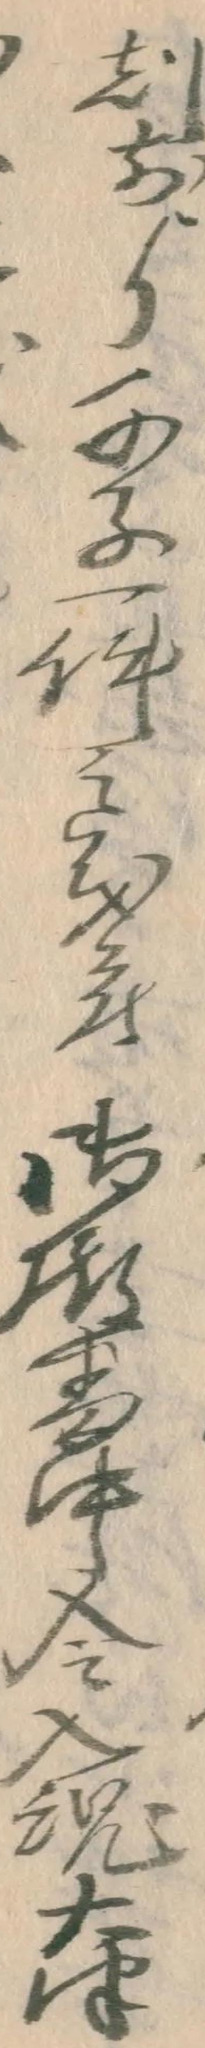刻前より千子一件之義ニ付御殿番中令入魂大津
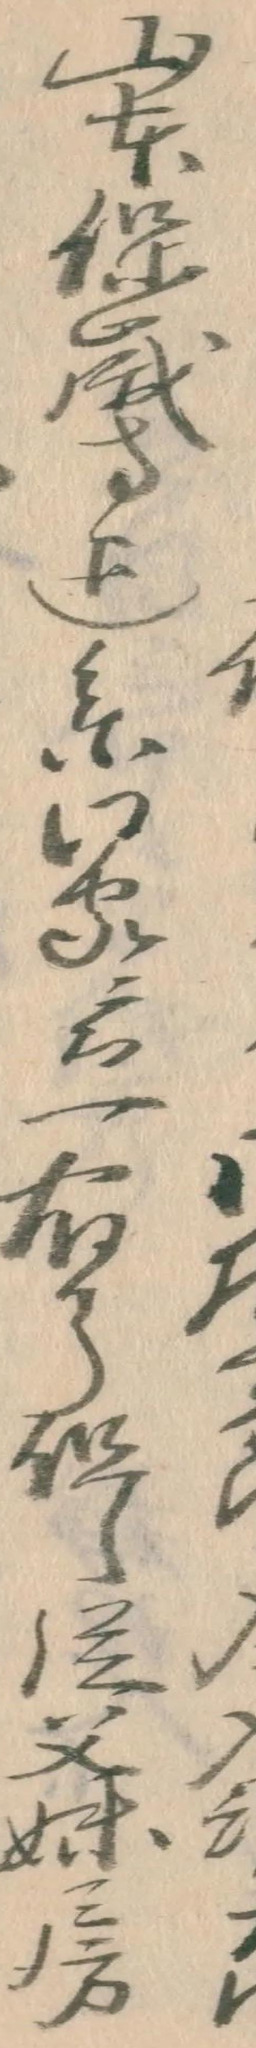山本保歳方迄参同家ニ而一宿了但し従父妹三方
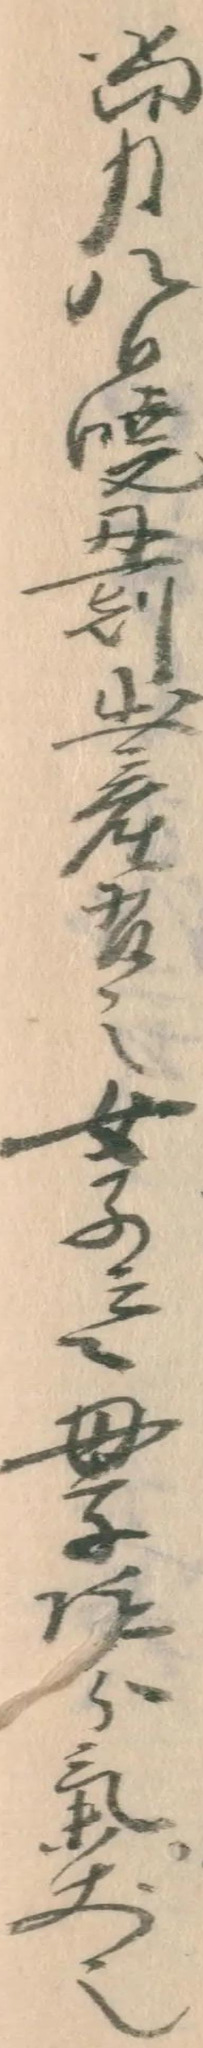當月八日暁丑刻出産有之女子云々母子随分気丈也
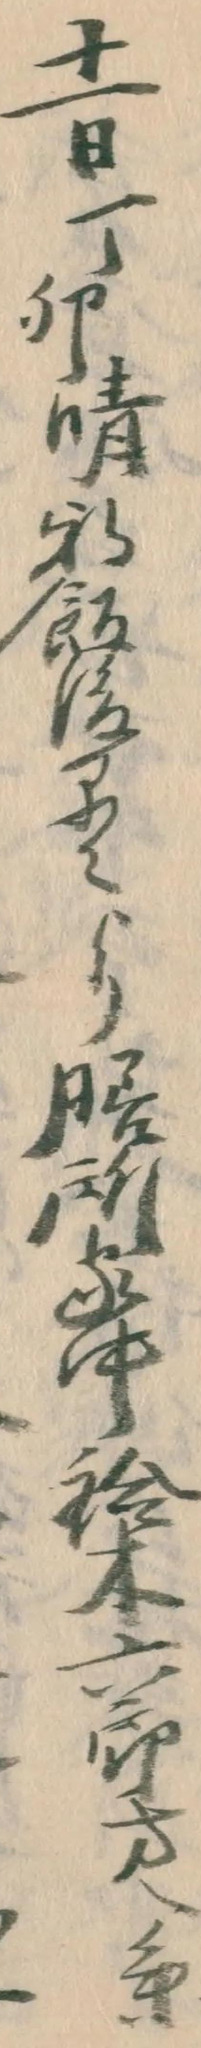十一日丁卯晴朝飯後早〻より膳所家中鈴木六郎方へ参
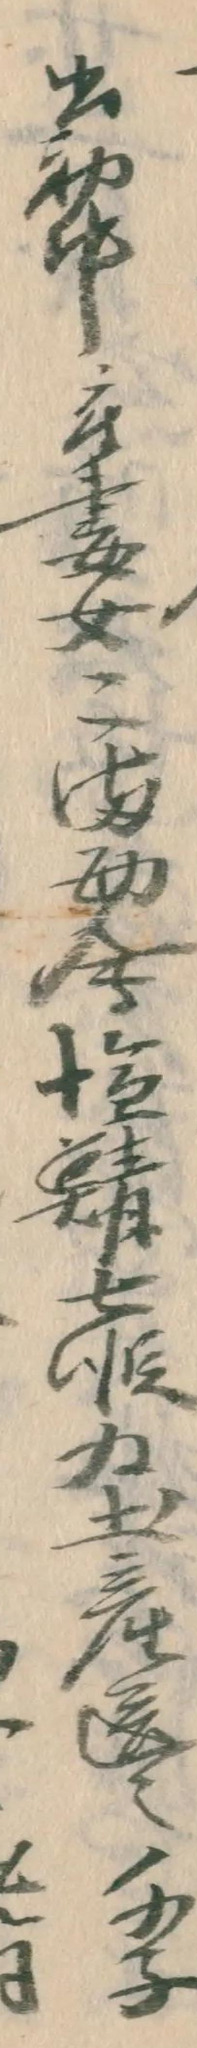出勤中ニ付妻女こま勘會塩鯖七喉為出産送之千子
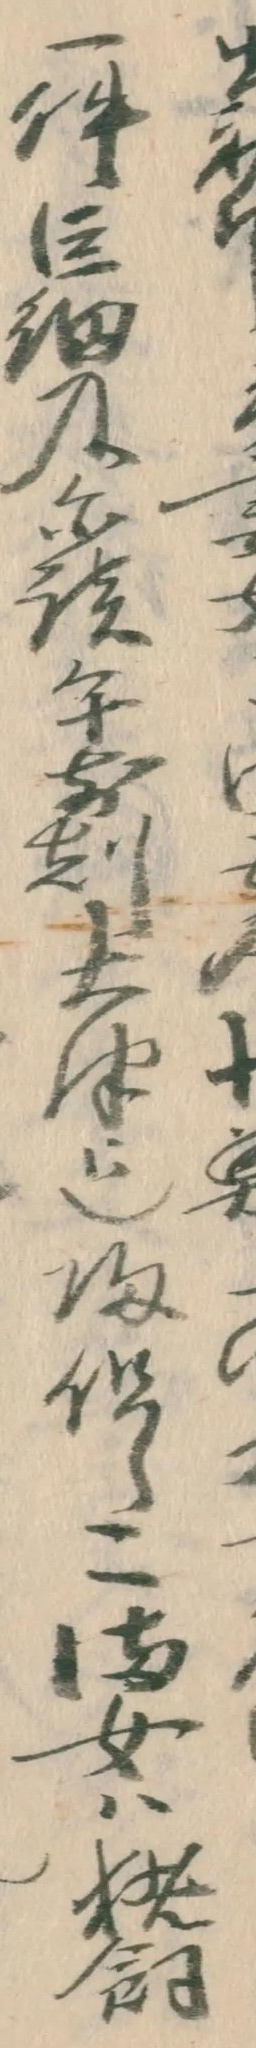一件巨細及示談午前刻大津迄帰但しこま女ハ猪飼
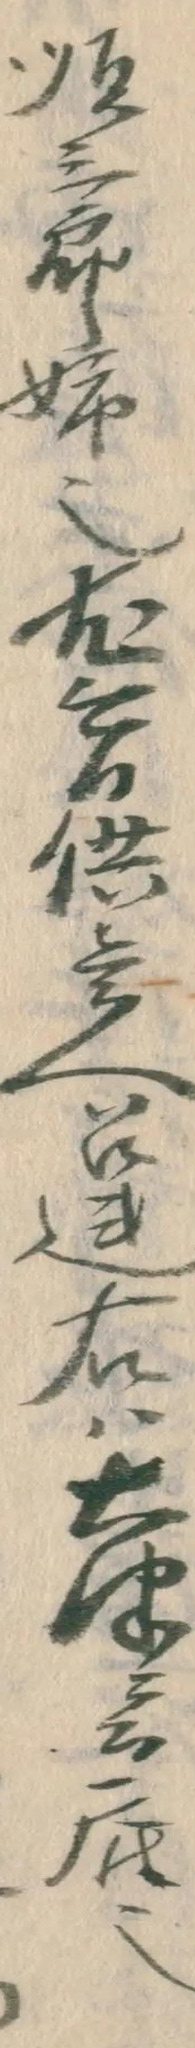順三郎姉也尤今日供壱人召連右ハ大津ニ而雇也
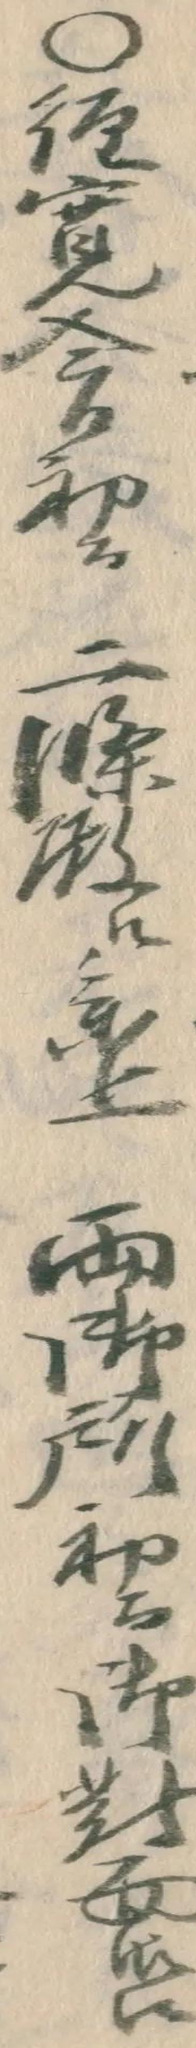○経寛今日初而二條殿え参上両御所初而御對面御口
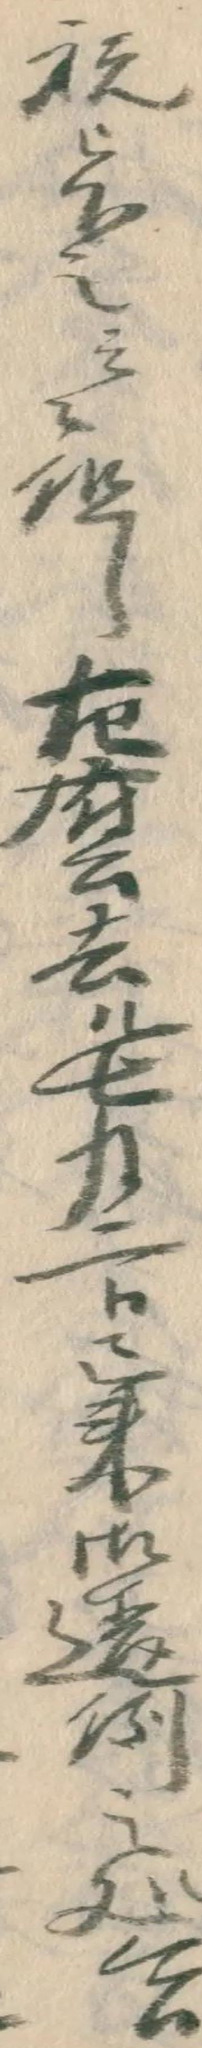祝被下之云々但し左府去ル七月二日已来御違例之処今日
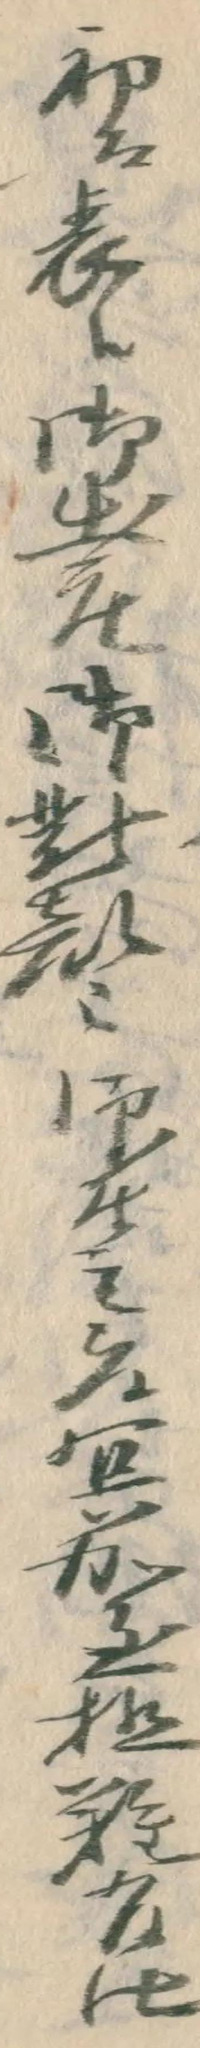初而表之御出座御對顔被仰付之旨宜加至極難有仕
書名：賀茂社記録. 第67冊
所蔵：国立国会図書館 National Diet Library, JAPAN
